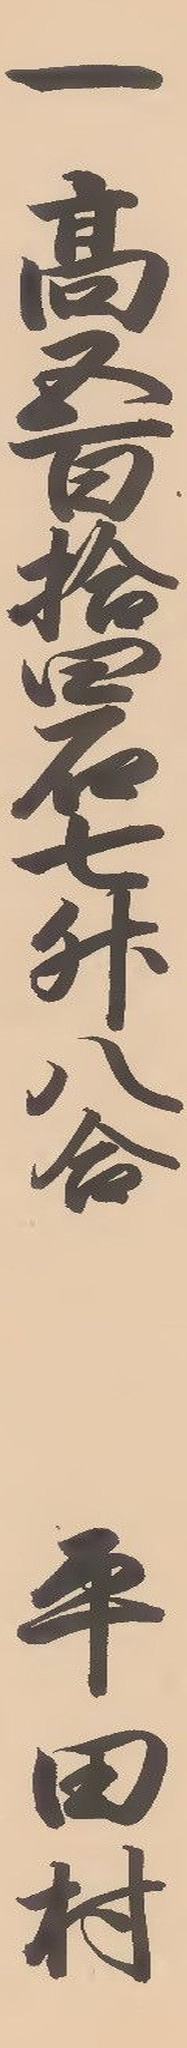一高五百拾四石七升八合平田村
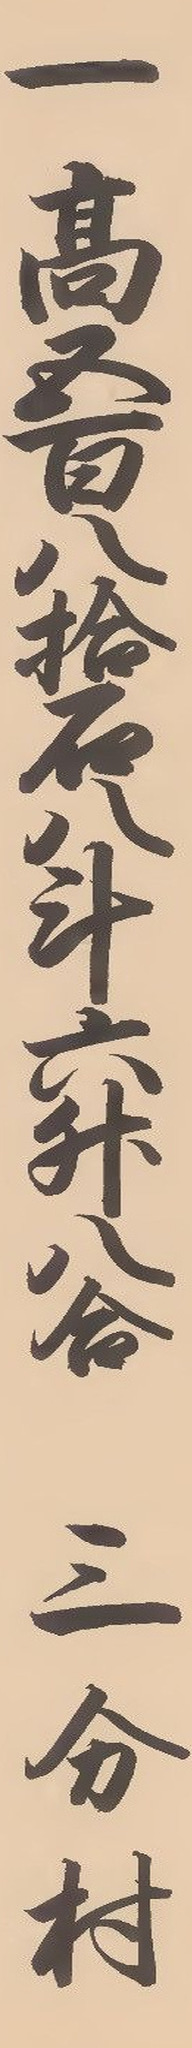一高五百八拾石八斗六升八合三分村

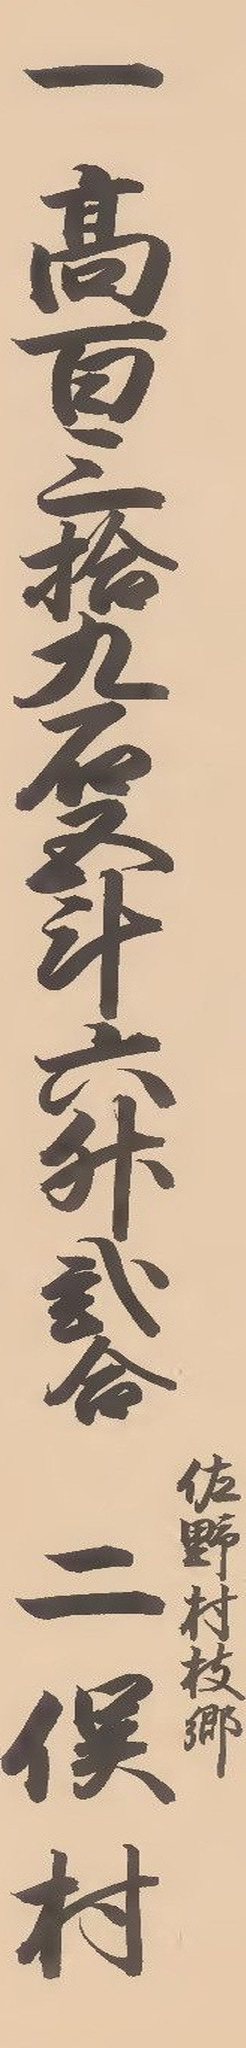一高百三拾四石五斗弐升野中村
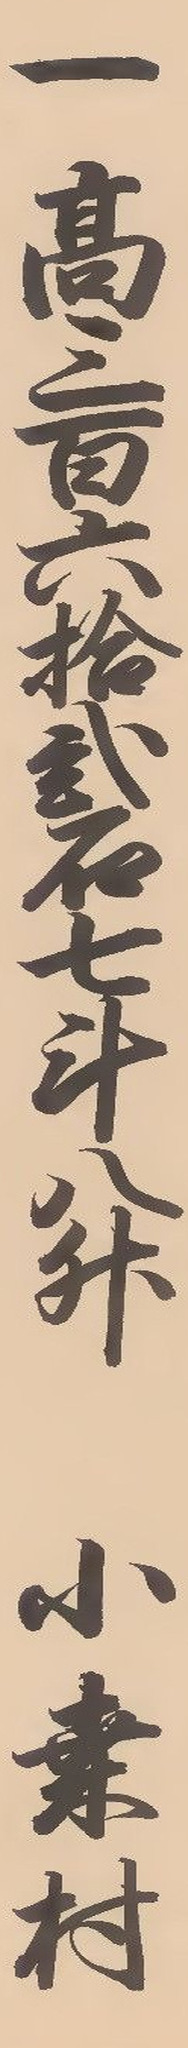一高三百六拾弐石七斗八升小桑村
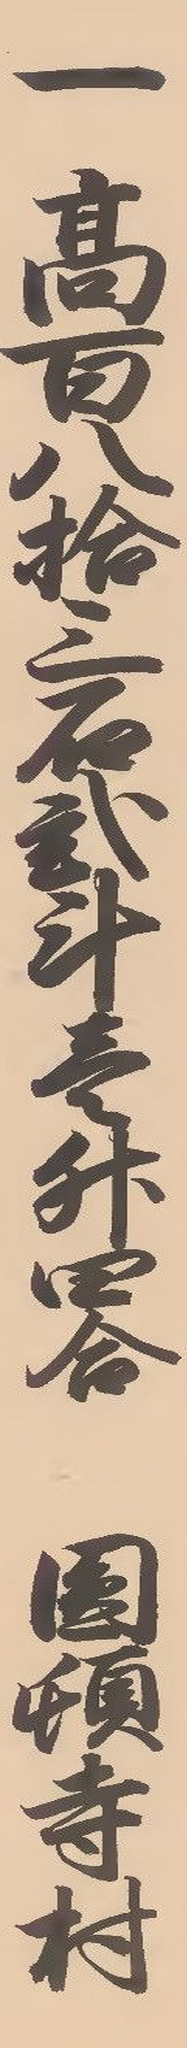一高百八拾三石弐斗壱升四合円頓寺村
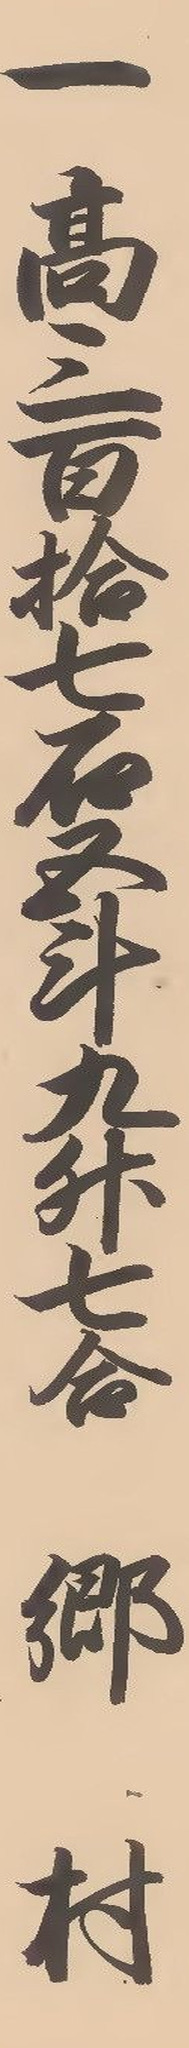一高三百拾七石五斗九升七合郷村
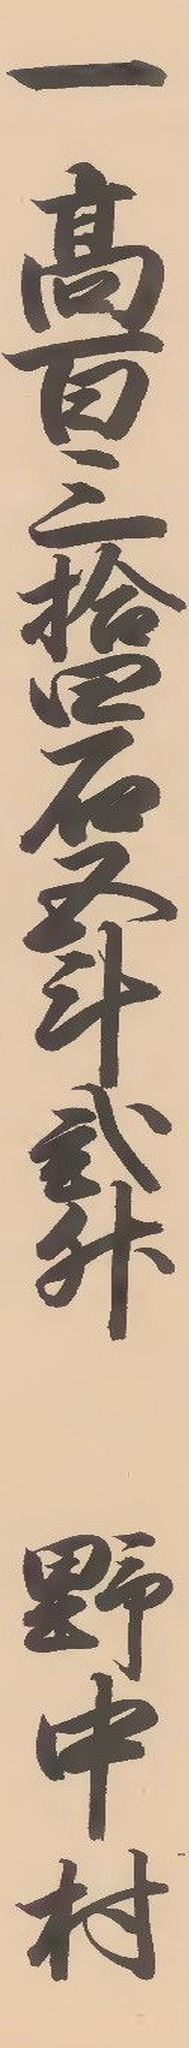一高百三拾四石五斗弐升野中村
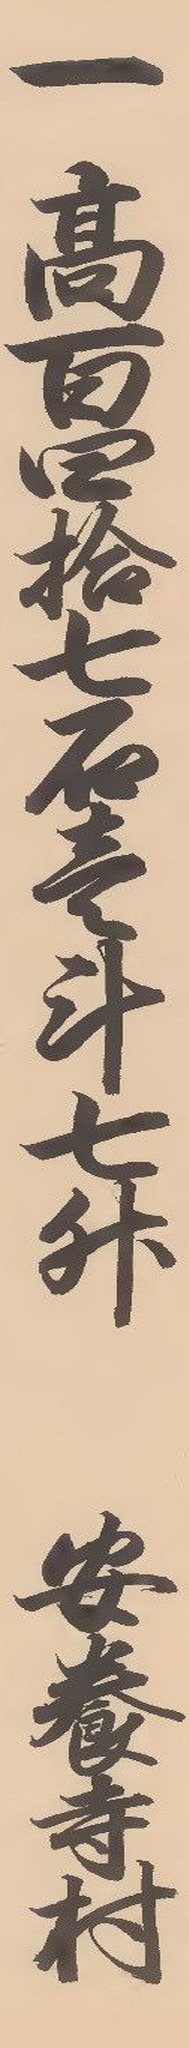一高百四拾七石壱斗七升安養寺村
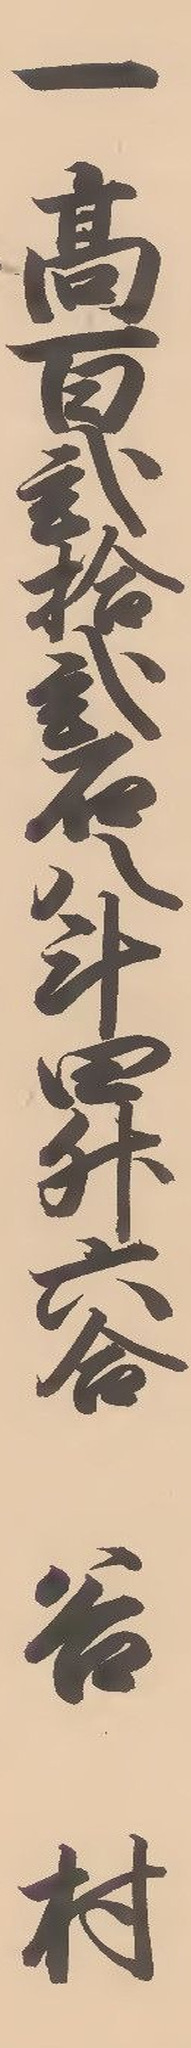一高百弐拾弐石八斗四升六合谷村

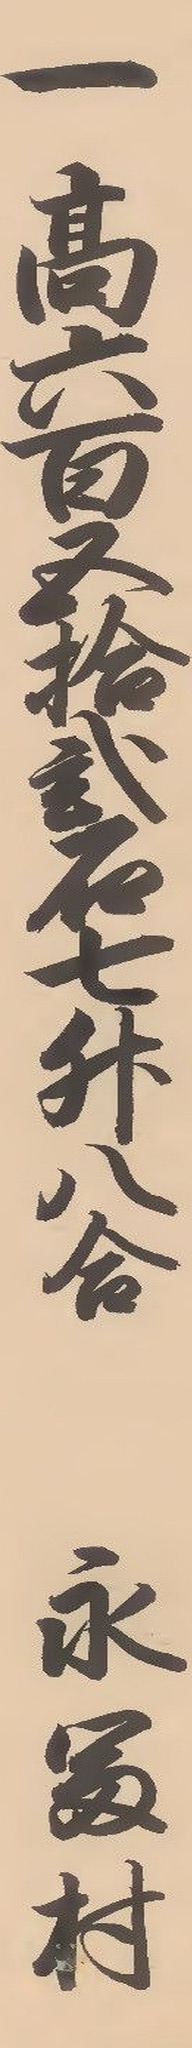一高六百五拾弐石七升八合永富村
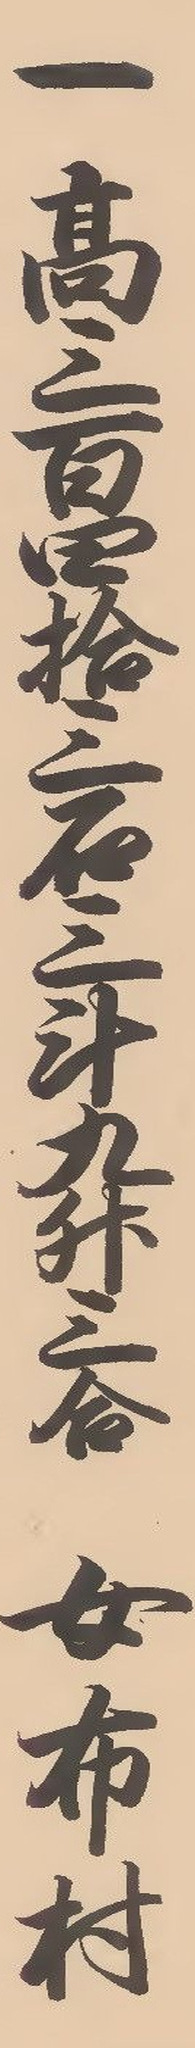一高三百四拾三石三斗九升三合女布村
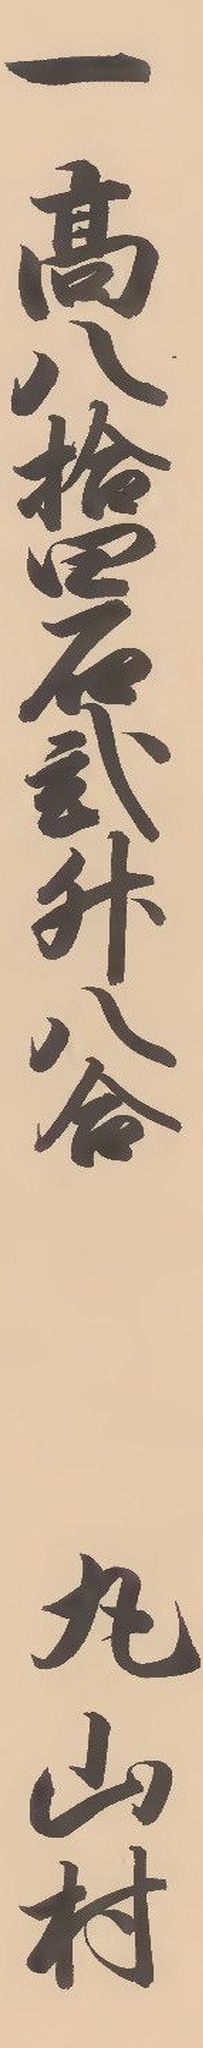一高八拾四石弐升八合丸山村
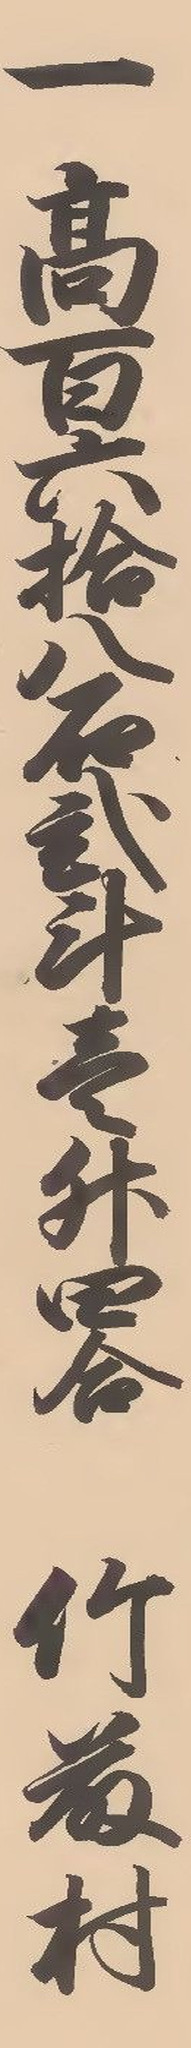一高百六拾八石弐斗壱升四合竹藤村
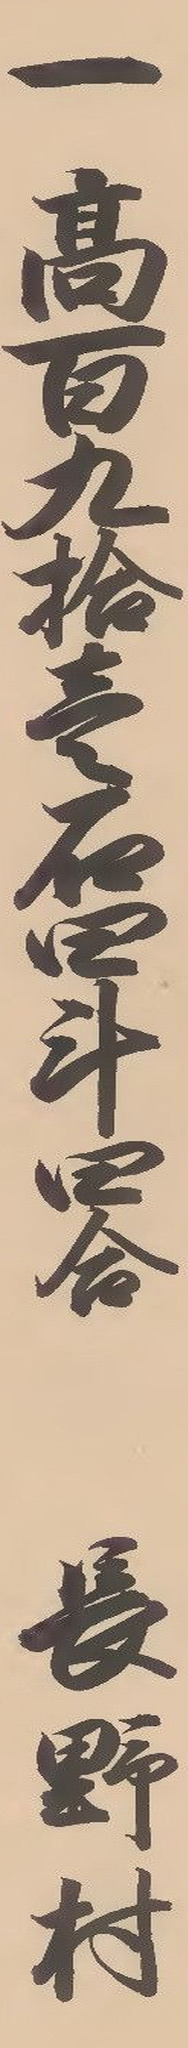一高百九拾壱石四斗四合長野村
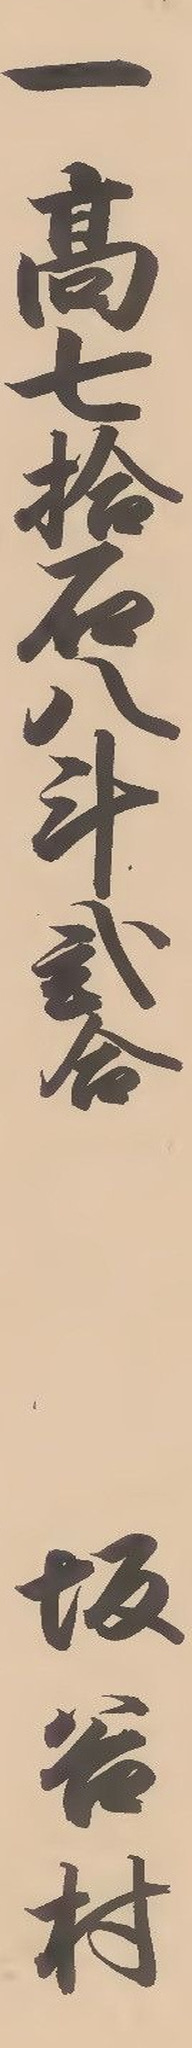一高七拾石八斗弐合坂谷村
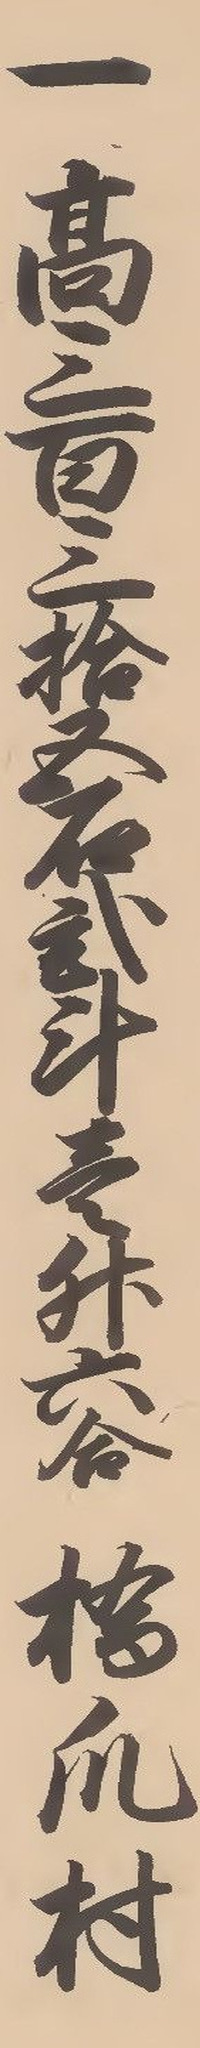一高三百三拾五石弐斗壱升六合橋爪村
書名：丹後国郷帳
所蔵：国立公文書館 National Archives of Japan
